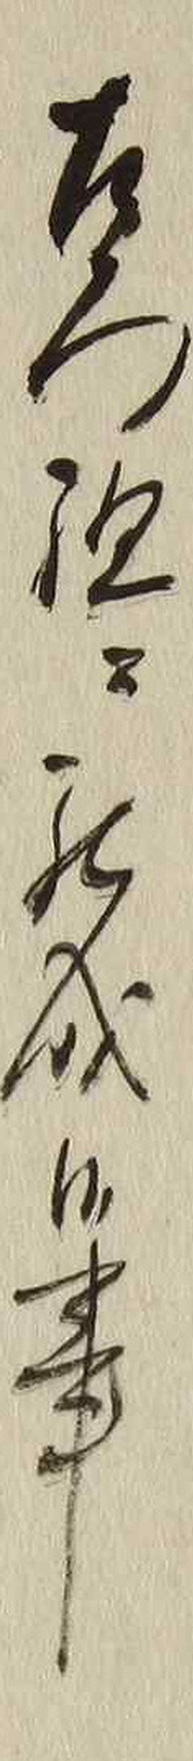左衛門組ニ罷成候事
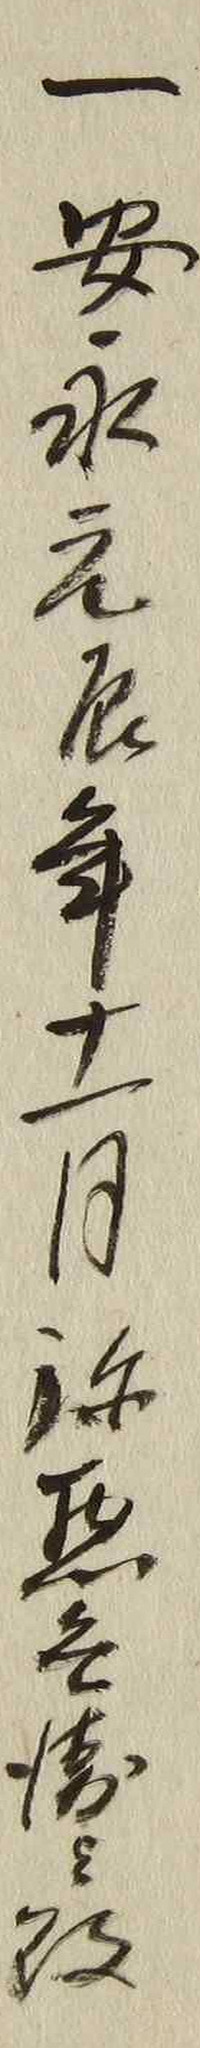一安水元辰年十一月弥惣兵衛与改
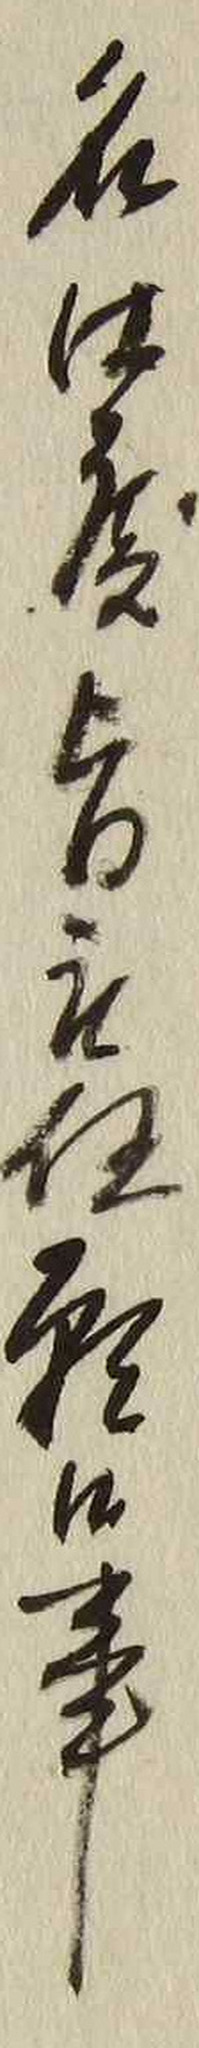名仕度旨被任願候事
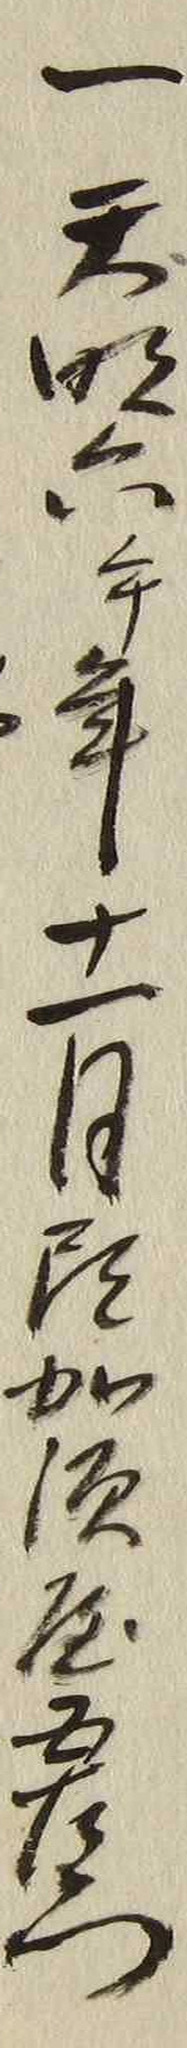一天明六午年十一月頭加須屋五左衛門
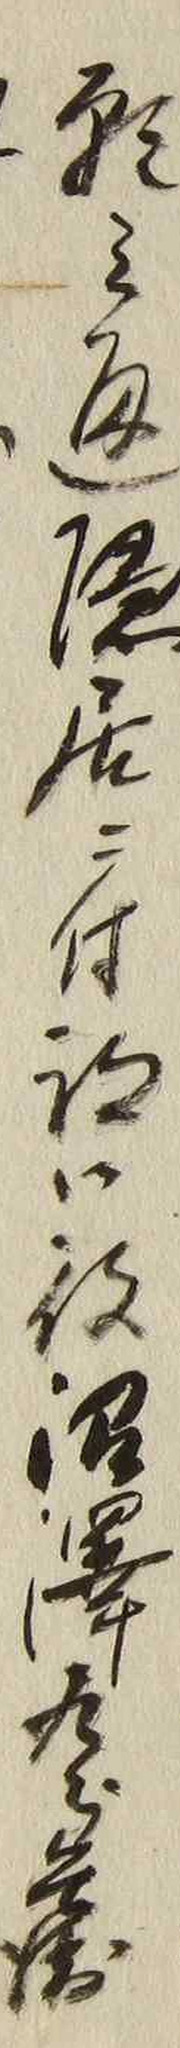願之通隠居ニ付跡御役沼沢九郎兵衛
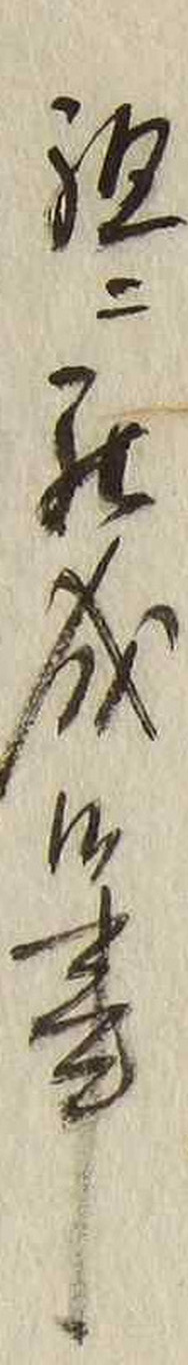組ニ罷成候事
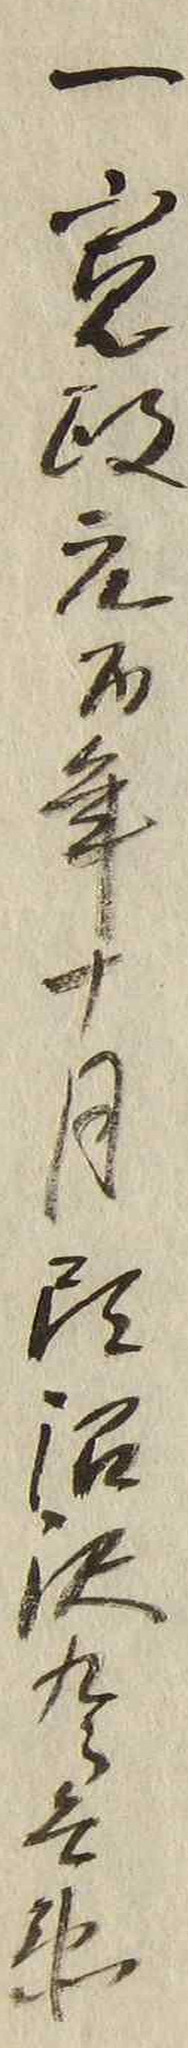一寛政元酉年十月頭沼沢九郎兵衛

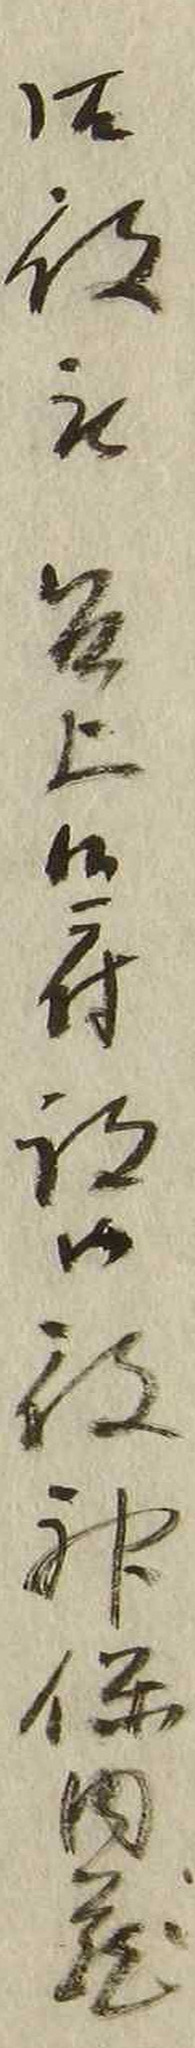御役被召上候ニ付跡御役神保内蔵
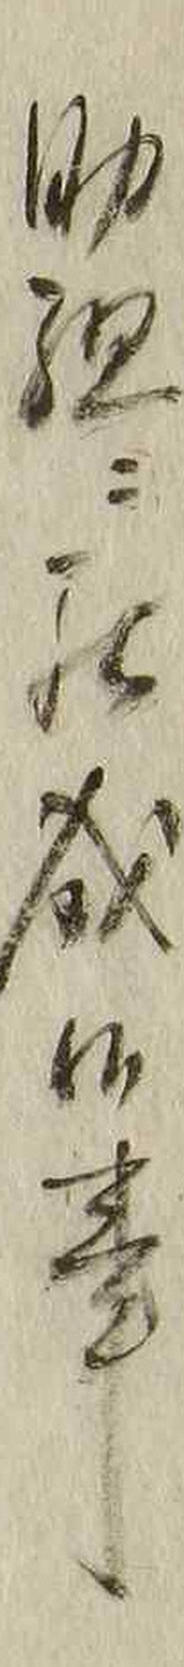助組ニ罷成候事
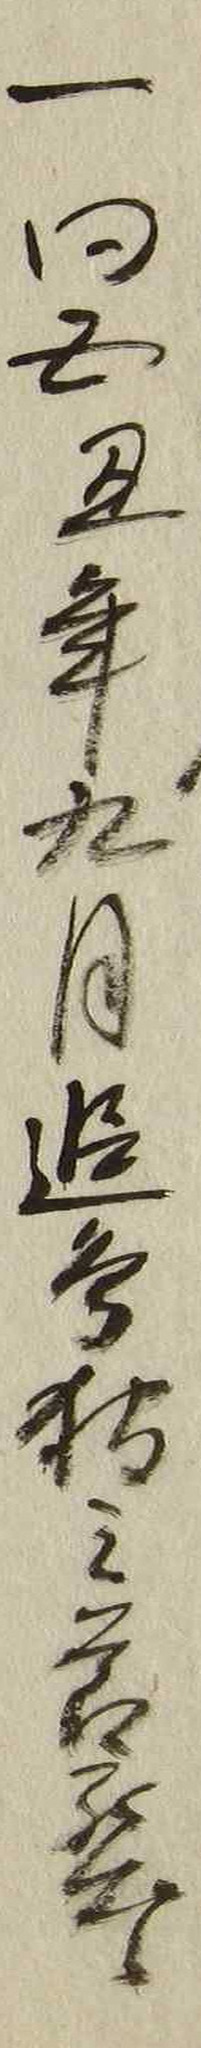一同五丑年九月追鳥狩之節罷出候
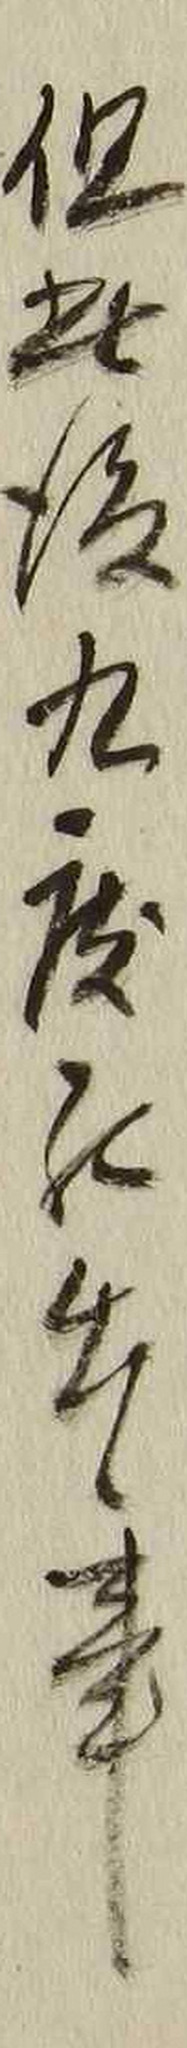但此後九度罷出候事
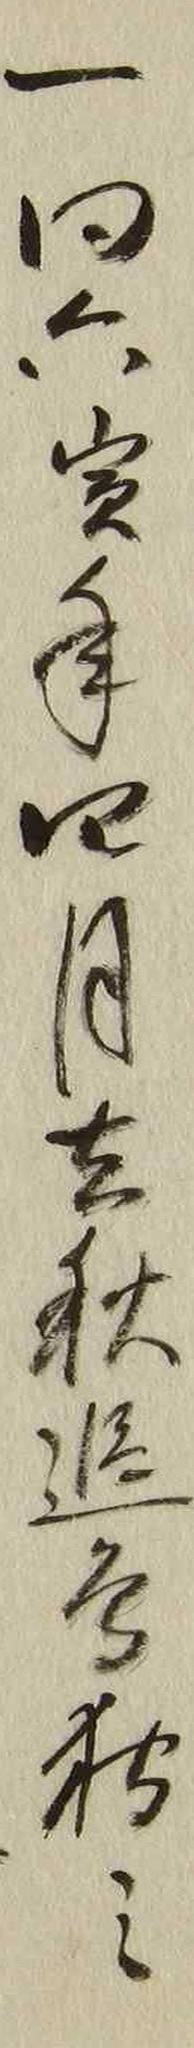一同六寅年四月去秋追鳥狩之
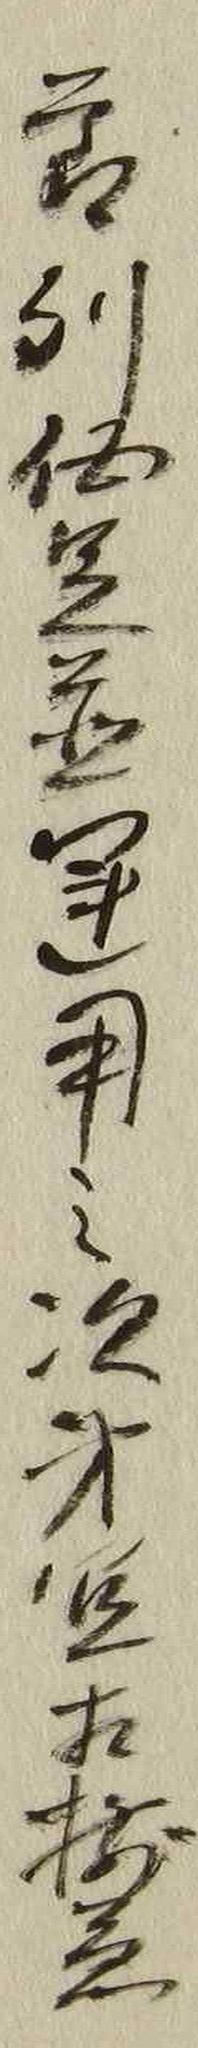節列伍足並運用之次第宜相揃兼
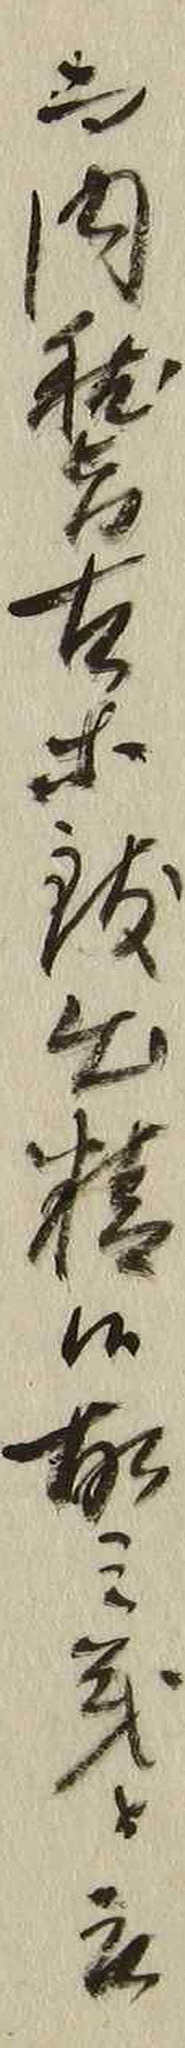而内稽古等致出精候故之義と被
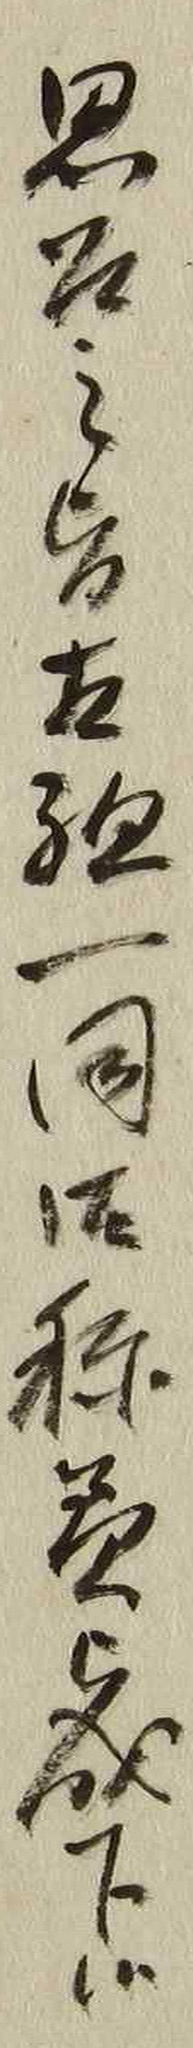思召之旨相組一同御称美被成下候
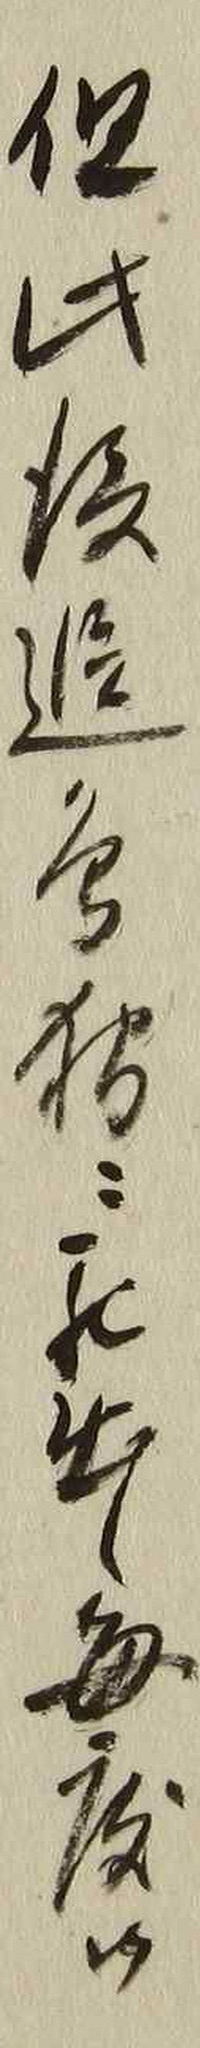但此後追鳥狩ニ罷出候毎度御
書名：諸士系譜　巻之359　す之部9
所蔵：会津若松市立会津図書館
